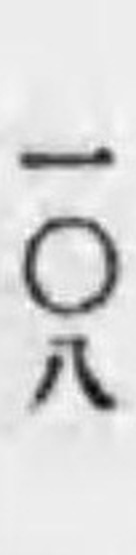一〇八
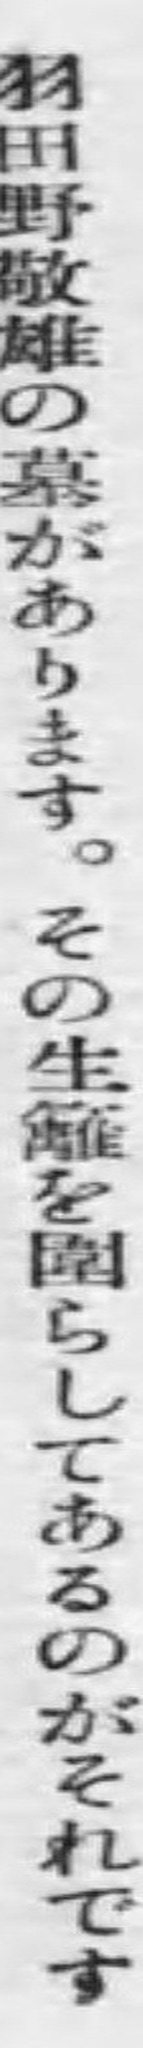羽田野敬雄の墓があります。その生籬を囲らしてあるのがそれです
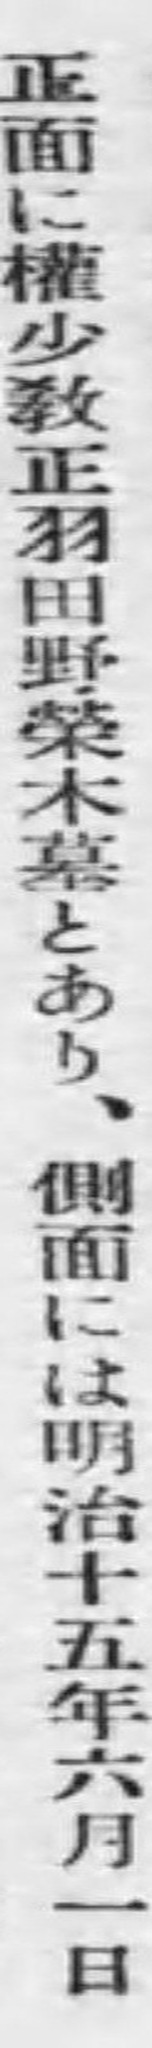正面に権少教正羽田野栄木墓とあり、側面には明治十五年六月一日
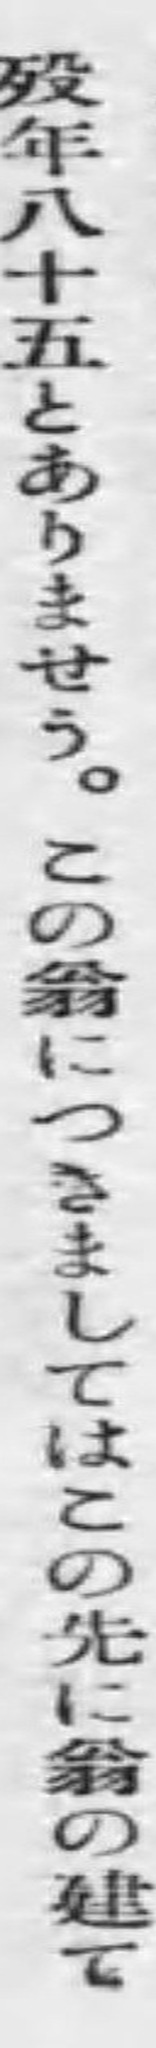歿年八十五とありませう。この翁につきましてはこの先に翁の建て
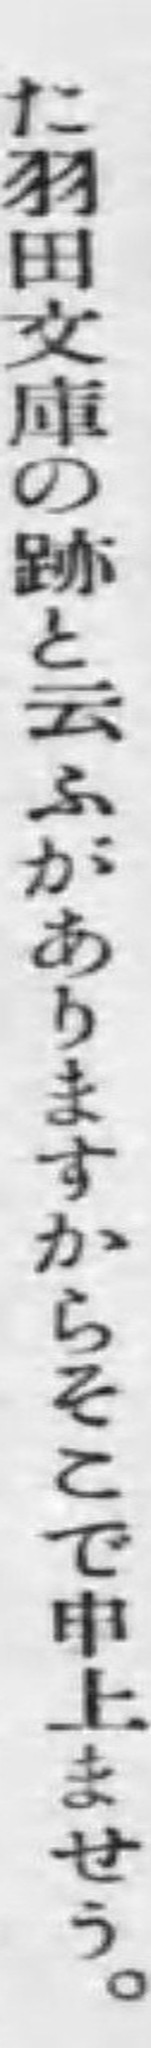た羽田文庫の跡と云ふがありますからそこで申上ませう。
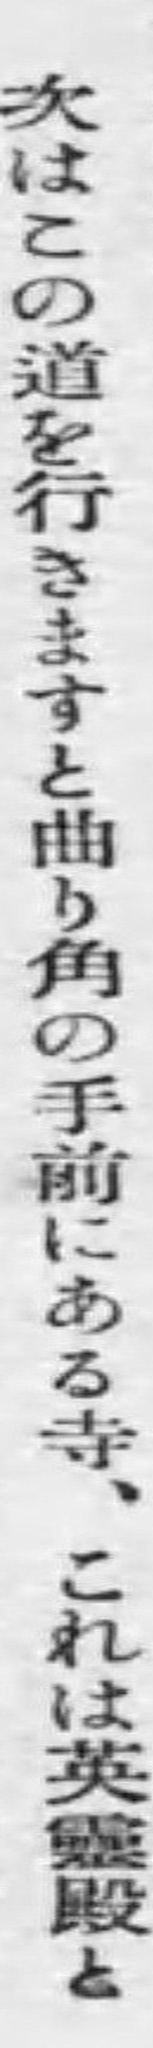次はこの道を行きますと曲り角の手前にある寺、これは英霊殿と
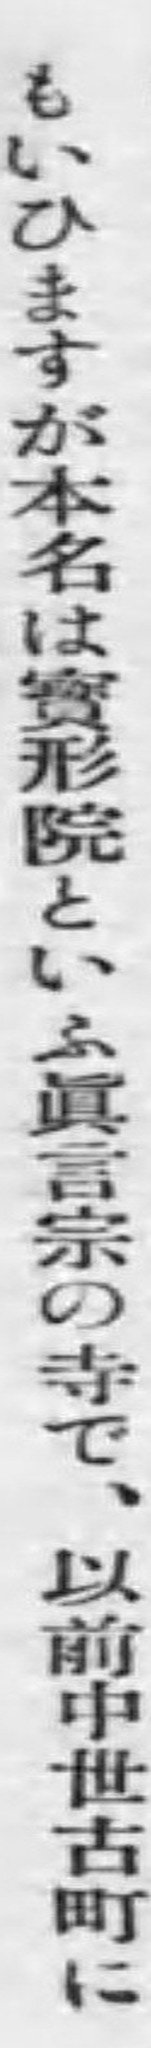もいひますが本名は宝形院といふ真言宗の寺で、以前中世古町に
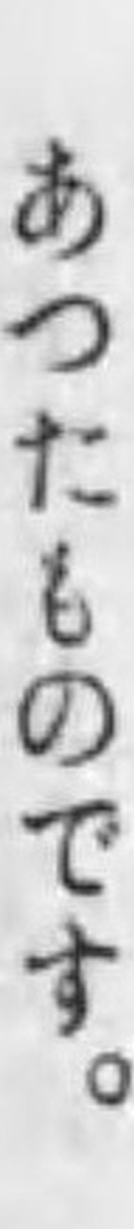あつたものです。
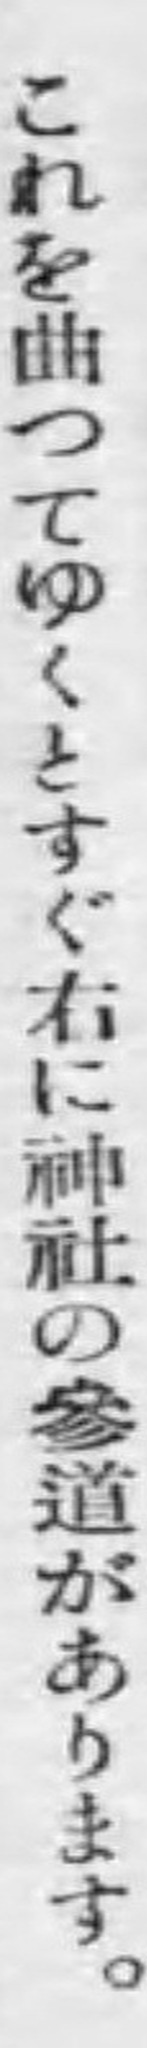これを曲つてゆくとすぐ右に神社の参道があります。
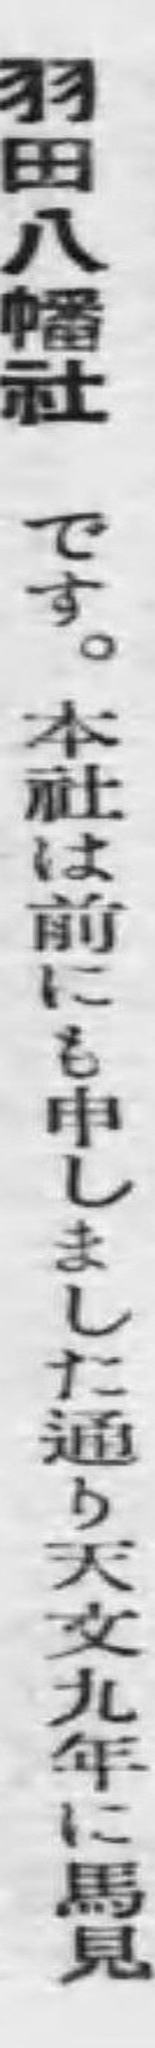羽田八幡社です。本社は前にも申しました通り天文九年に馬見
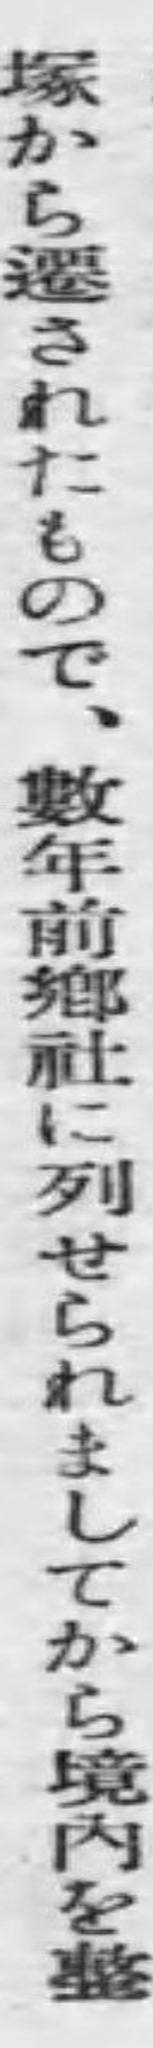塚から遷されたもので、数年前郷社に列せられましてから境内を整
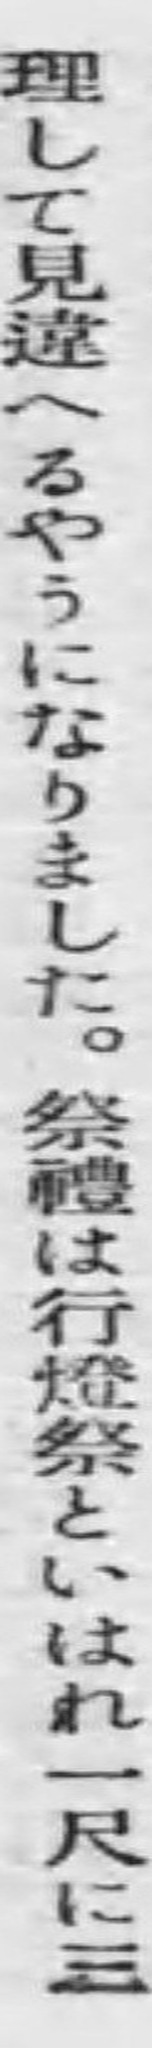理して見違へるやうになりました。祭礼は行灯祭といはれ一尺に三
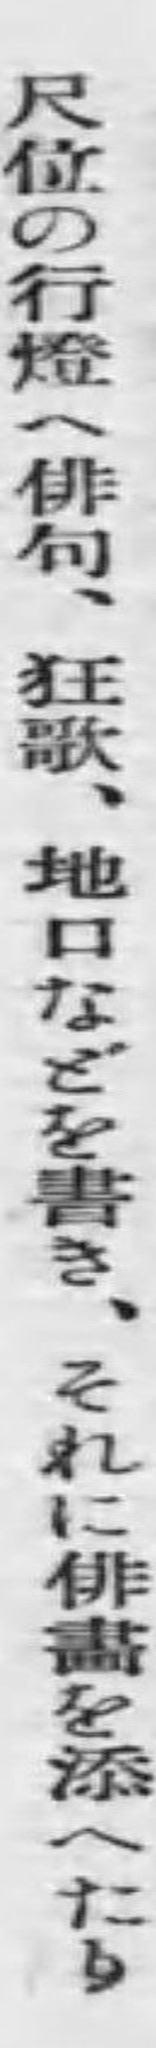尺位の行灯へ俳句、狂歌、地口などを書き、それに俳画を添へたり
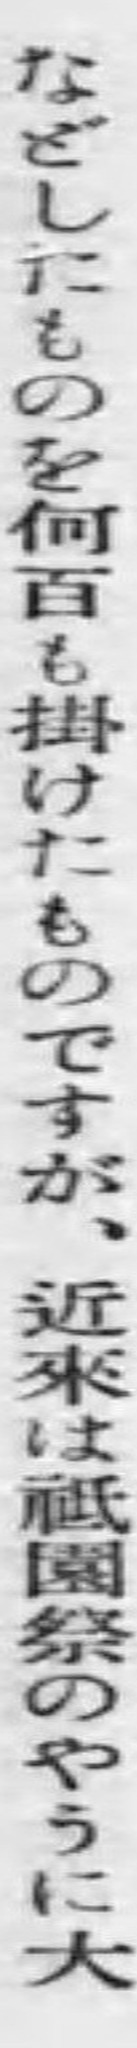などしたものを何百も掛けたものですが、近来は祗園祭のやうに大
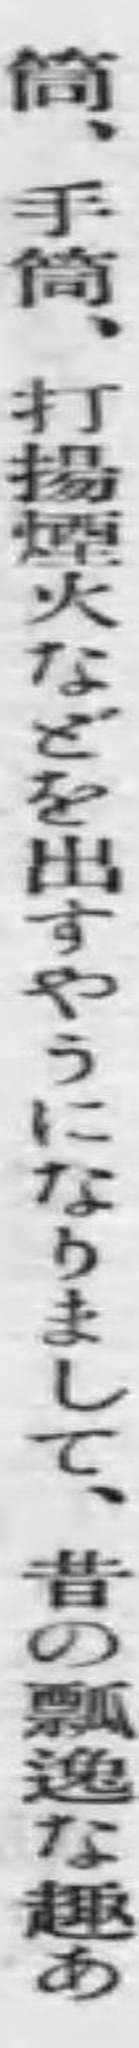筒、手筒、打揚煙火などを出すやうになりまして、昔の瓢逸な趣あ
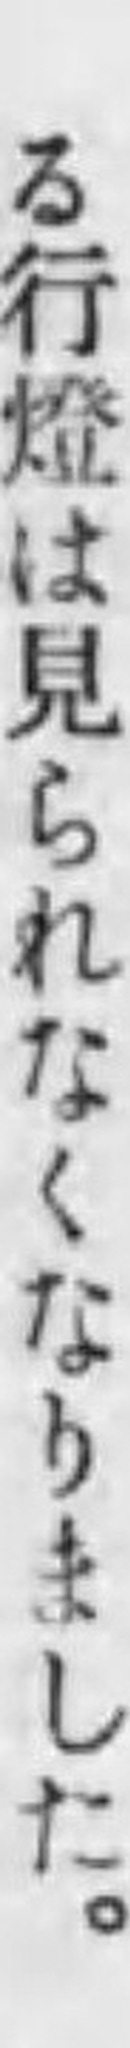る行灯は見られなくなりました。
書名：東三河道中記 : 豊橋市及其附近案内
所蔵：国立国会図書館 National Diet Library, JAPAN
